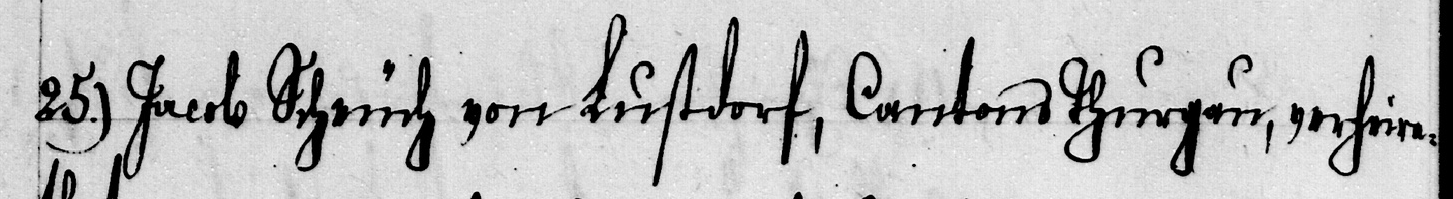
25.) Jacob Scheuch von Lustdorf, Cantons Thurgau, verhei¬
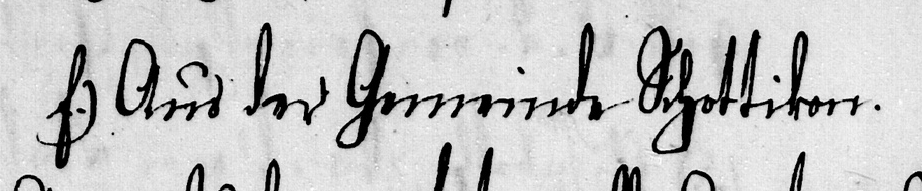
f.) Aus der Gemeinde Schottikon.
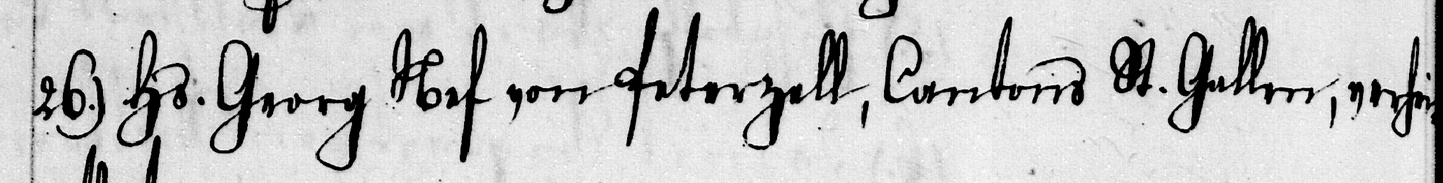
26.) Hs. Georg Nef von Peterzell, Cantons St. Gallen, v¬
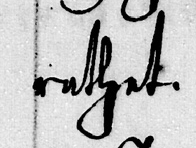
rathet.
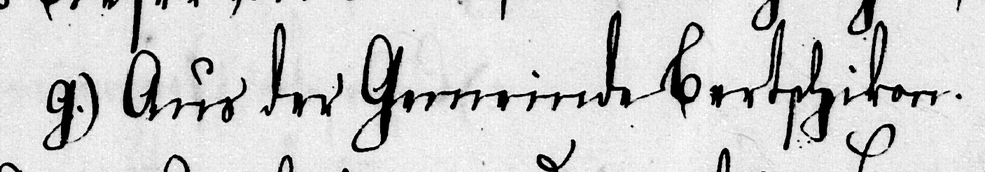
g.) Aus der Gemeinde Bertschikon.
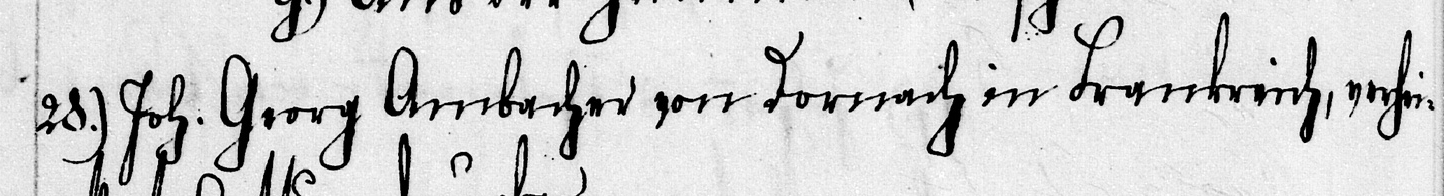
28.) Joh. Georg Ambacher von Dornach in Frankreich, verh¬
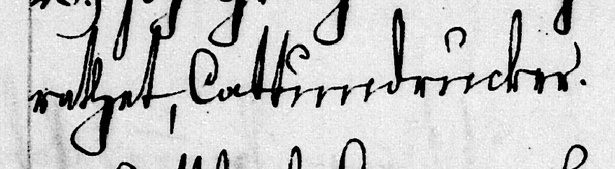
rathet, Cattundrucker.
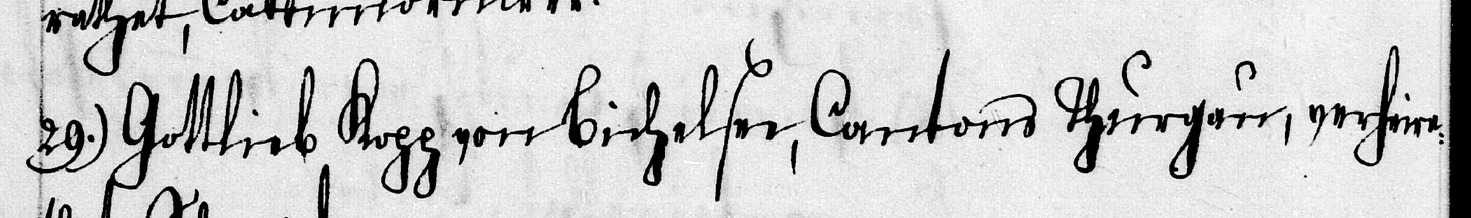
29.) Gottlieb Kopp von Bichelsee, Cantons Thurgau, verheir¬
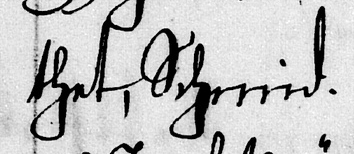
thet, Schmid.
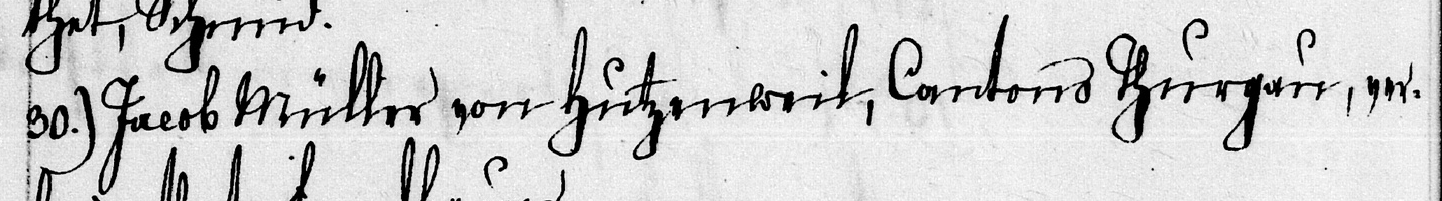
30.) Jacob Müller von Hutzenweil, Cantons Thurgau, ver¬
